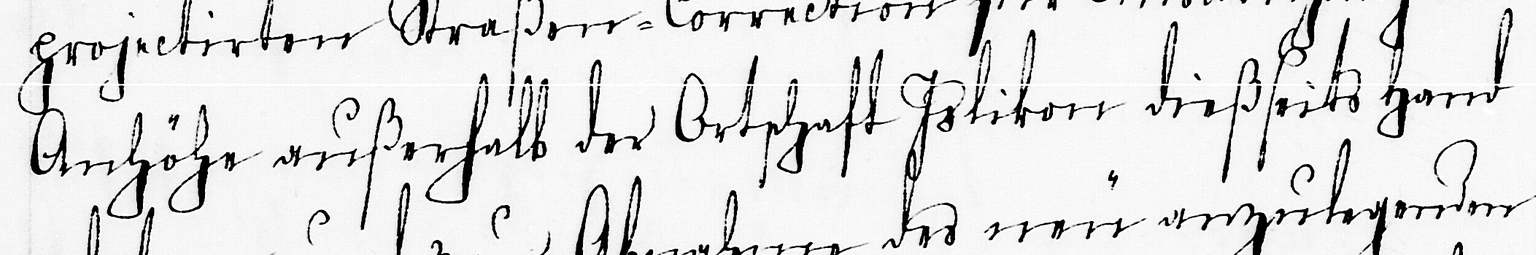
Anhöhe außerhalb der Ortschaft Islikon dießseits Hand
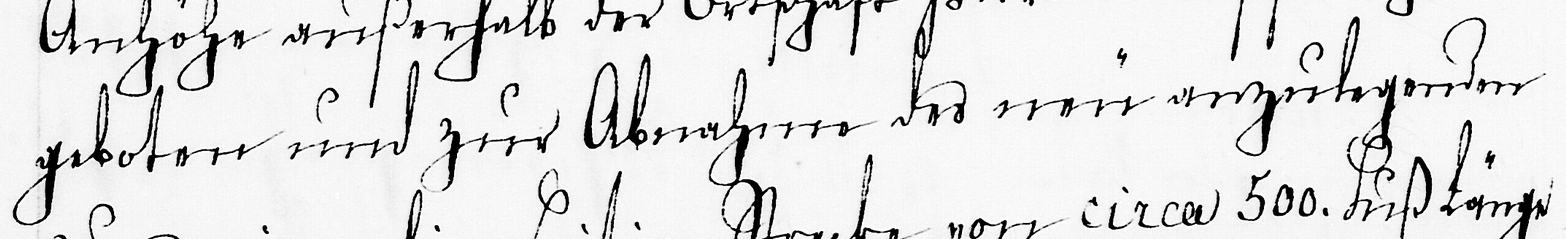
geboten und zur Abnahme des neu anzulegenden
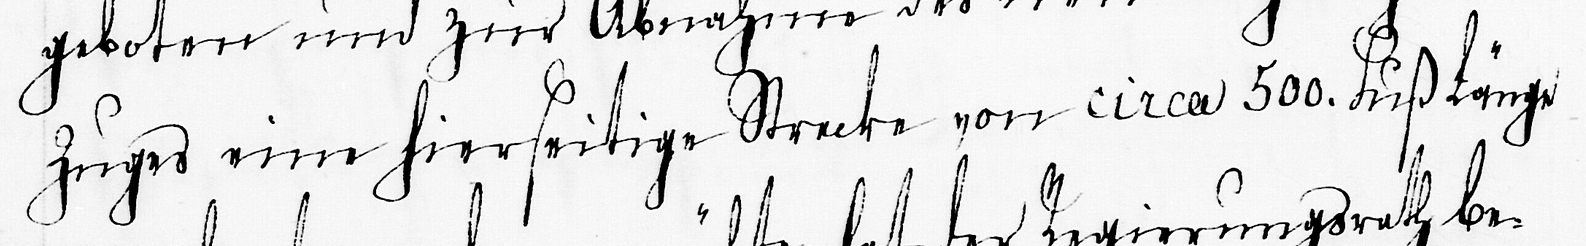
Zuges eine hierseitige Strecke von circa 500. Fuß Länge
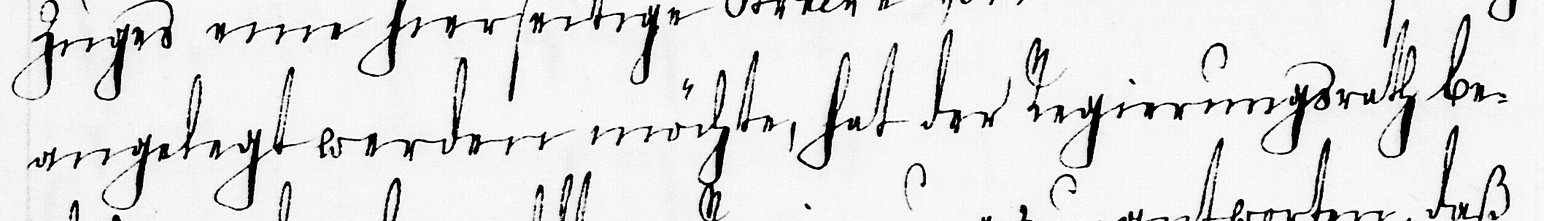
angelegt werden möchte, hat der Regierungsrath be¬
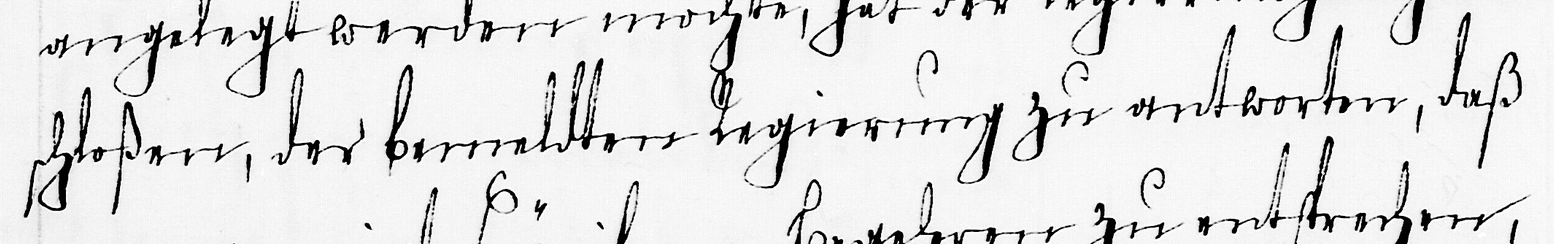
schloßen, der bemeldten Regierung zu antworten, daß
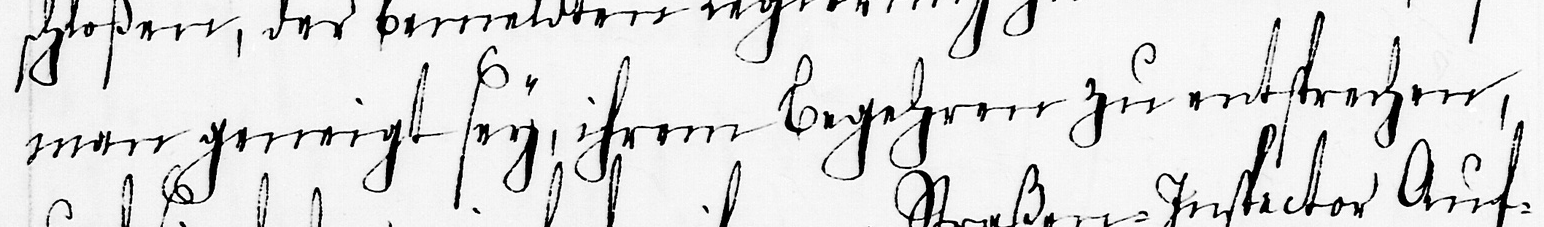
man geneigt sey, ihrem Begehren zu entsprechen,
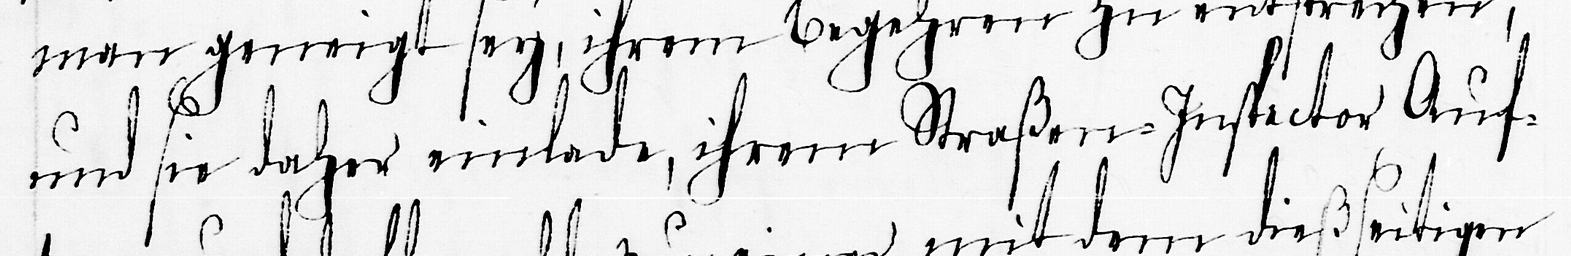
und sie daher einlade, ihrem Straßen-Inspector Auf¬
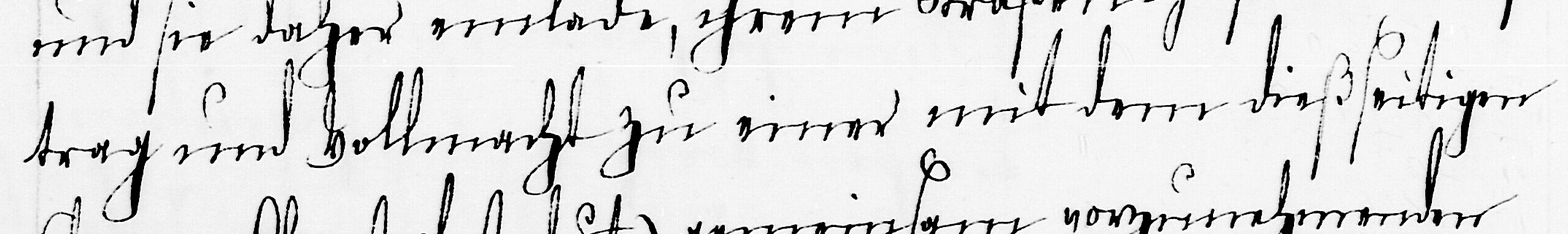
trag und Vollmacht zu einer mit dem dießseitigen
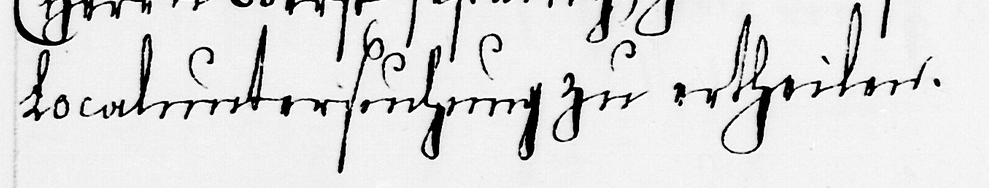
Localuntersuchung zu ertheilen.
